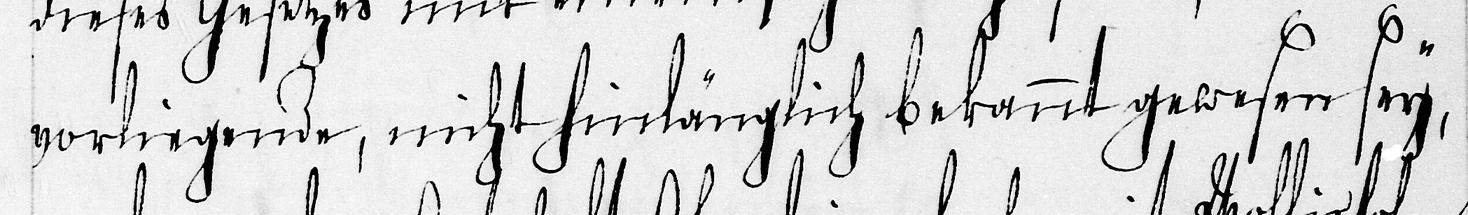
vorliegende, nicht hinlänglich bekannt gewesen sey,
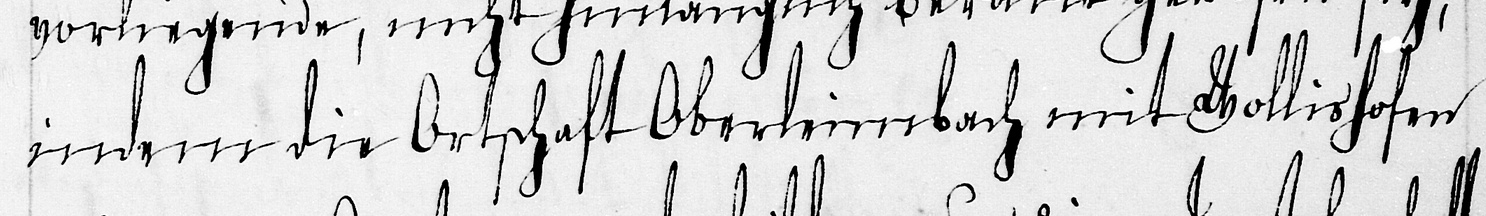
indem die Ortschaft Oberleimbach mit Wollishofen
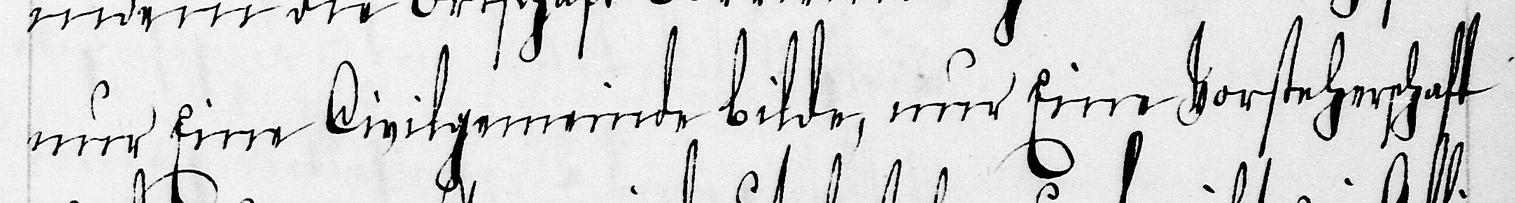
nur Eine Civilgemeinde bilde, nur Eine Vorsteherschaft
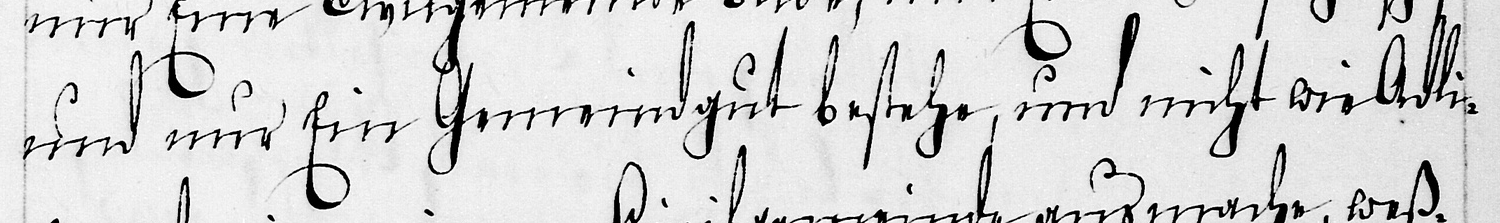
und nur Ein Gemeindgut bestehe, und nicht wie Adli¬
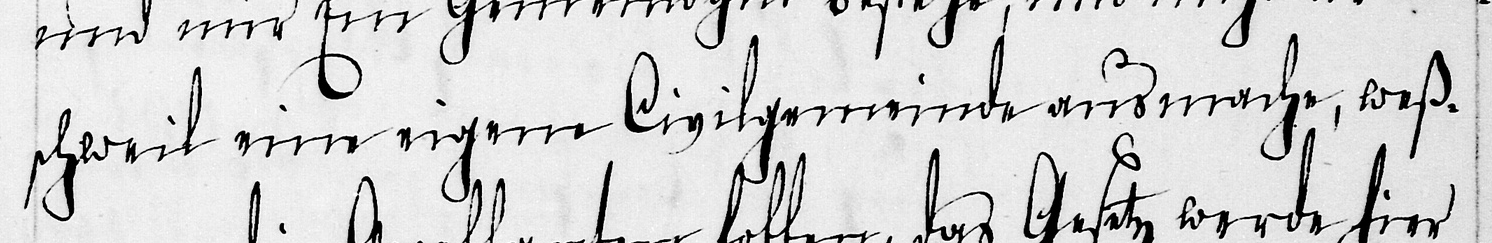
schweil eine eigene Civilgemeinde ausmache, weß¬
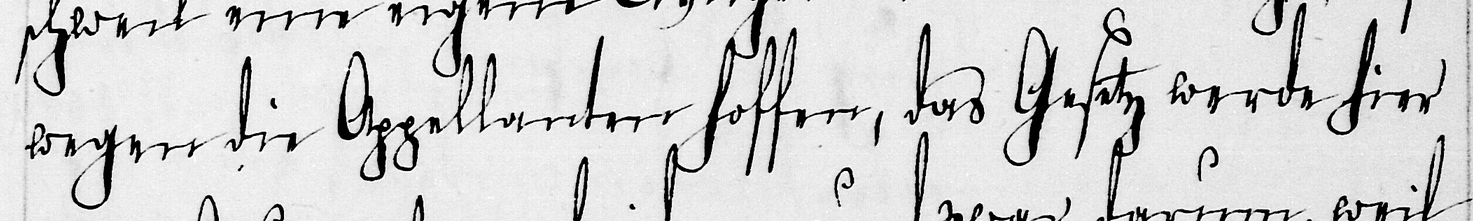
wegen die Appellanten hoffen, das Gesetz werde hier
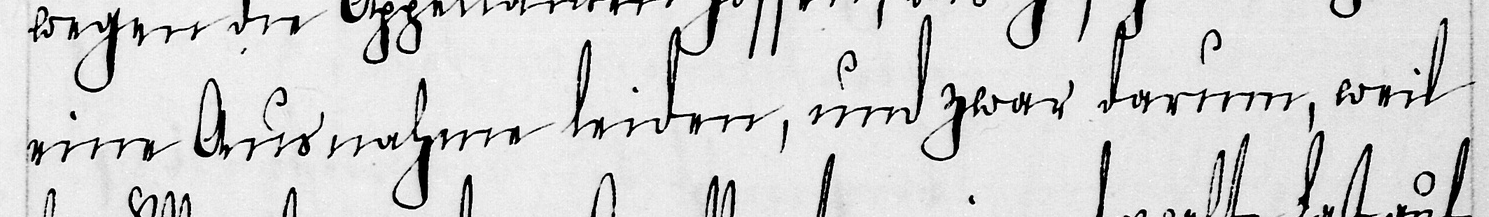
eine Ausnahme leiden, und zwar darum, weil
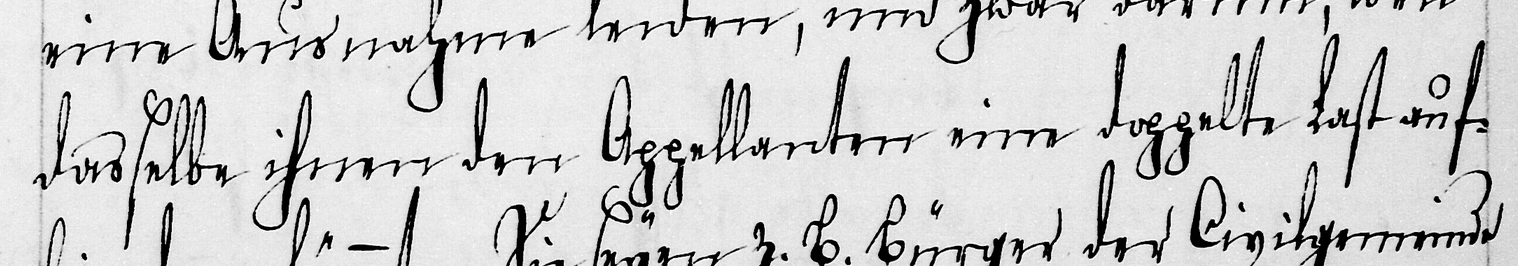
dasselbe ihnen den Appellanten eine doppelte Last
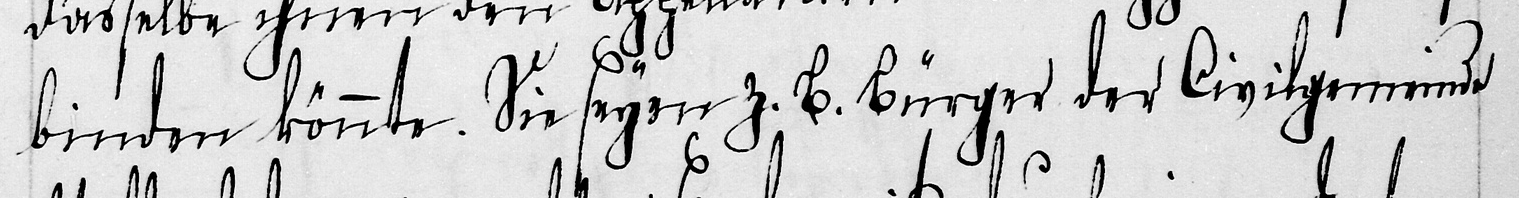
binden könnte. Sie seyen z. B. Bürger der Civilgemeinde
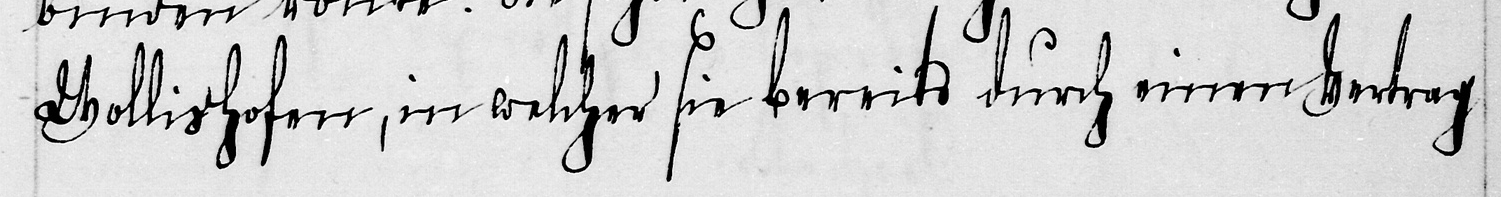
Wollishofen, in welcher sie bereits durch einen Vertrag
